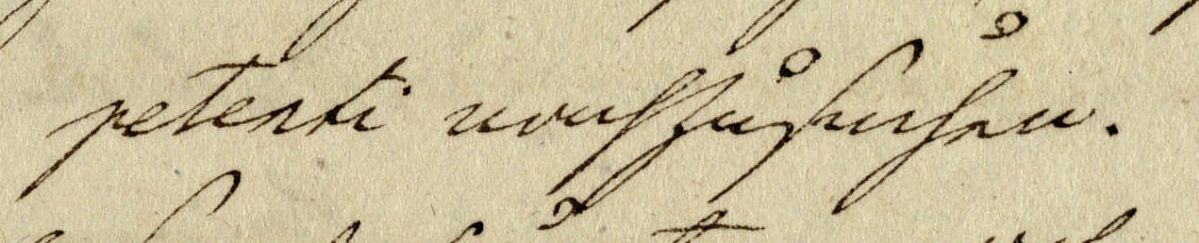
petenti nachzusuchen.
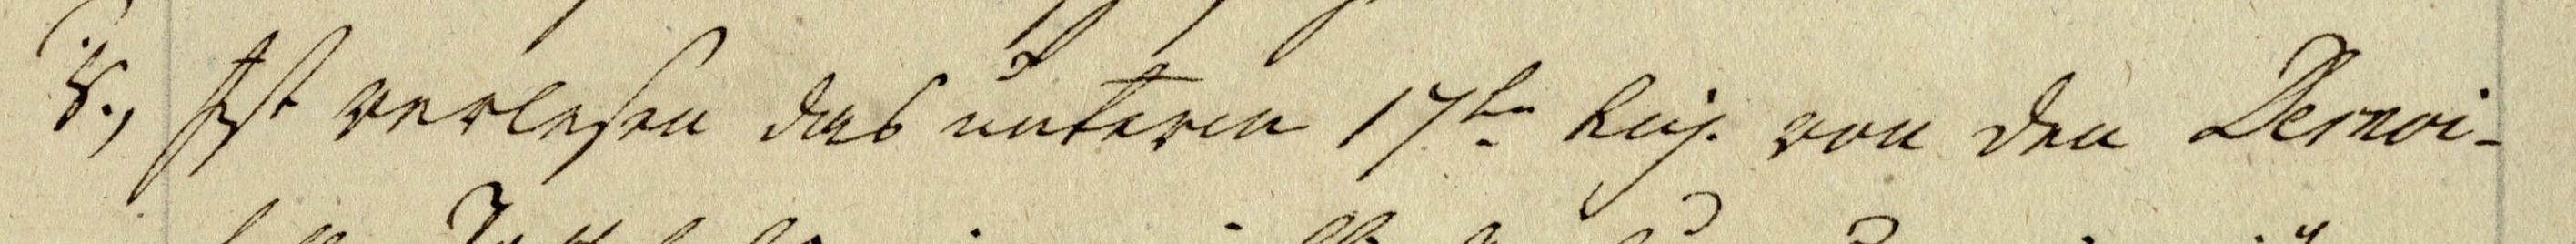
8., Ist verlesen das unterm 17 ten huj. von den Demoi¬
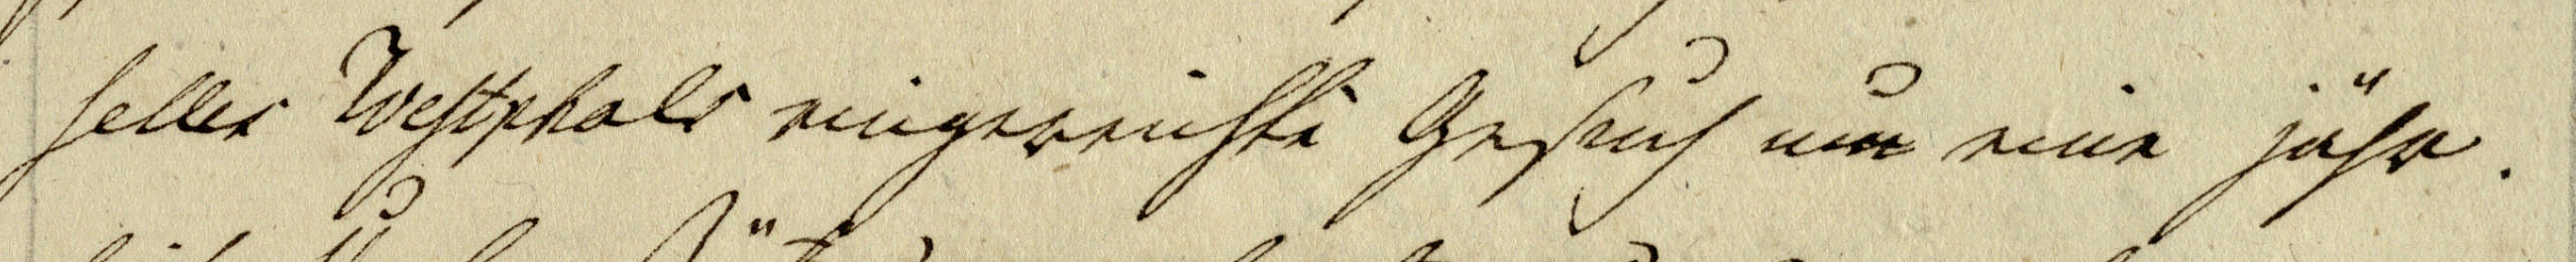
selles Westphals eingereichte Gesuch um eine jähr¬
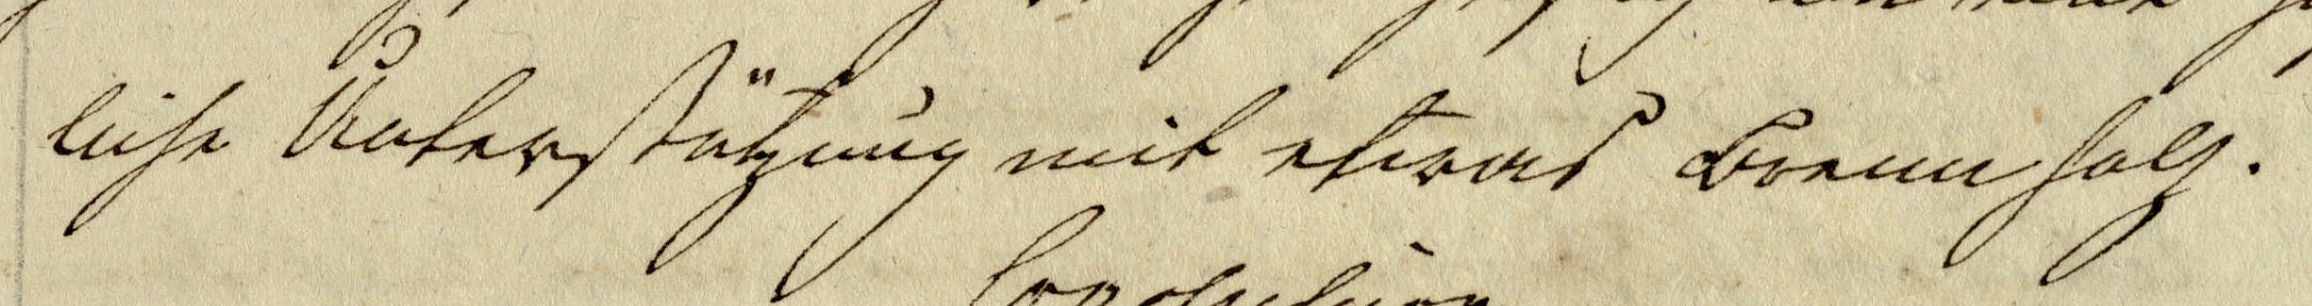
liche Unterstützung mit etwas Brennholz.
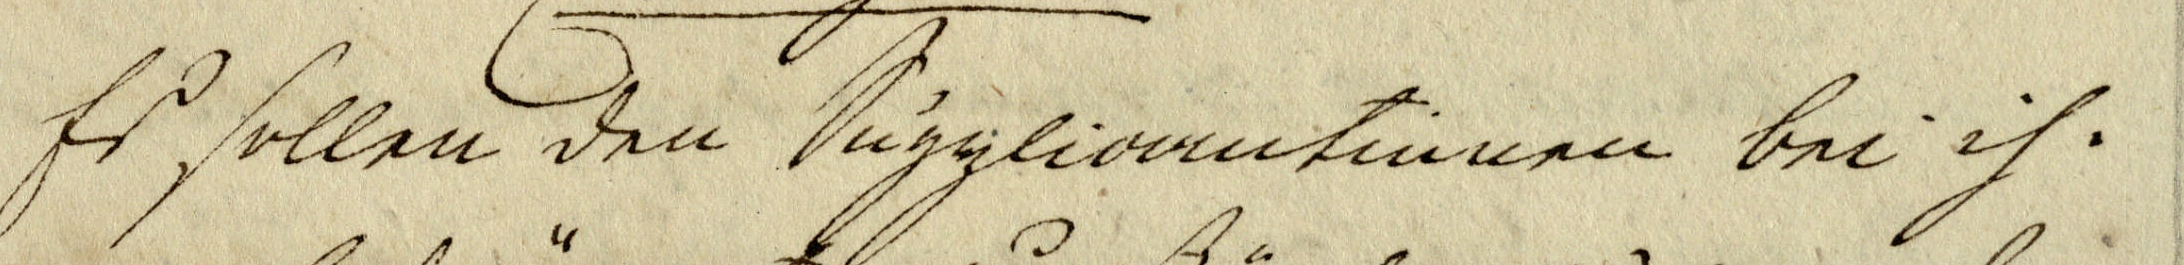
Es sollen den Supplicantinnen bei ih¬
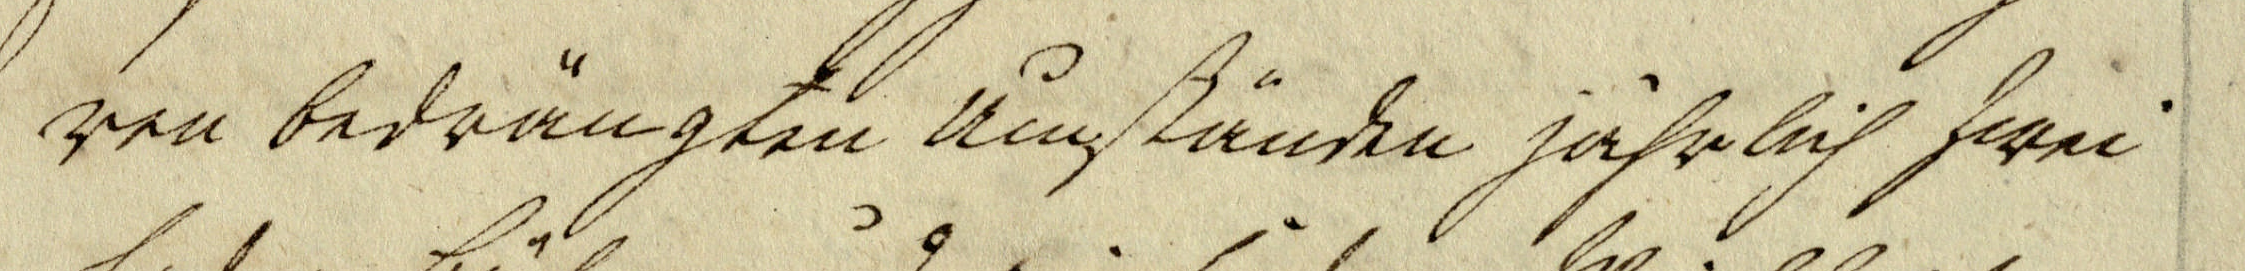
ren bedrängten Umständen jährlich zwei
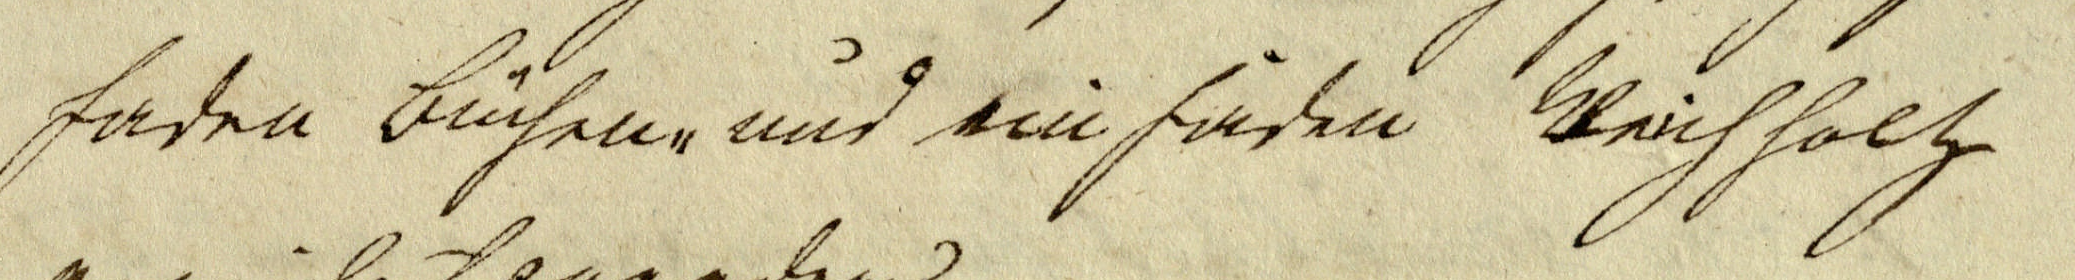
Faden Buchen- und ein Faden Weichholz
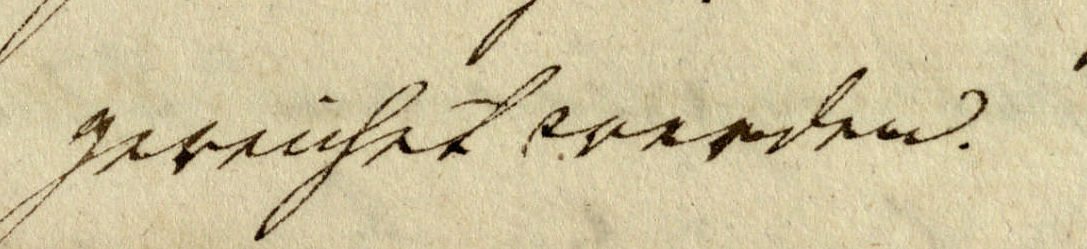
gereichet werden.
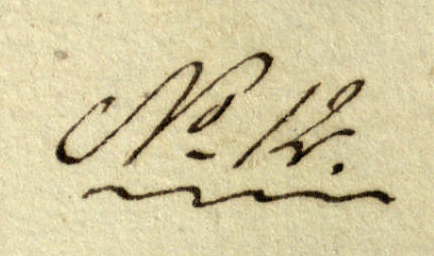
No 12.
